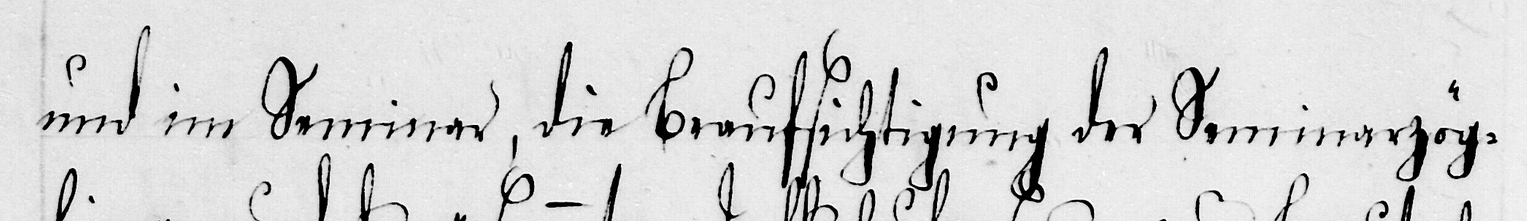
und im Seminar, die Beaufsichtigung der Seminarzög¬
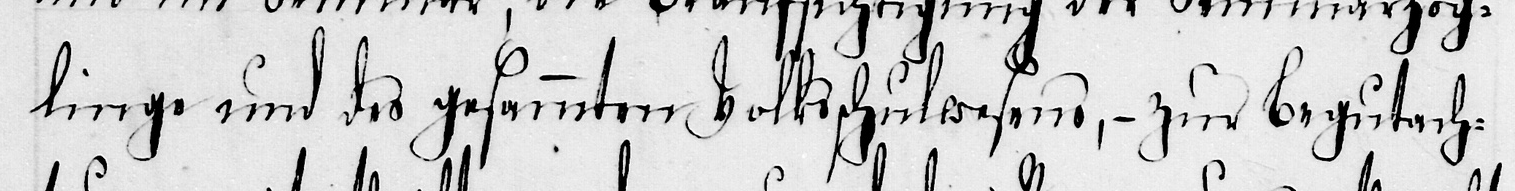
linge und des gesammten Volksschulwesens, – zur Begutach¬
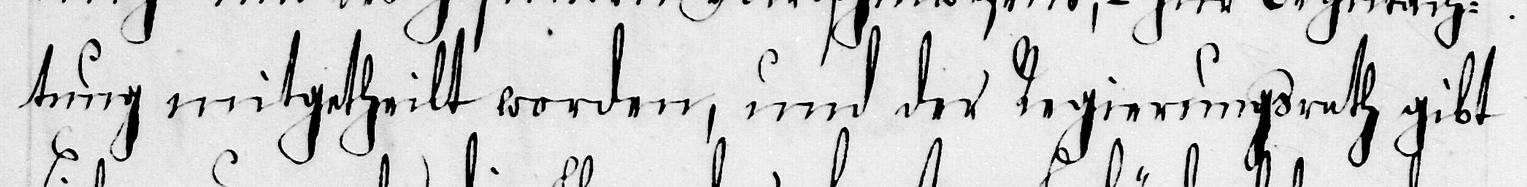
tung mitgetheilt worden, und der Regierungsrath gibt
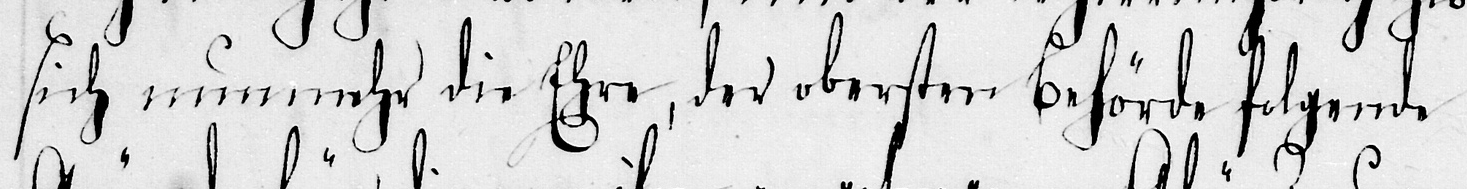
sich nunmehr die Ehre, der obersten Behörde folgende
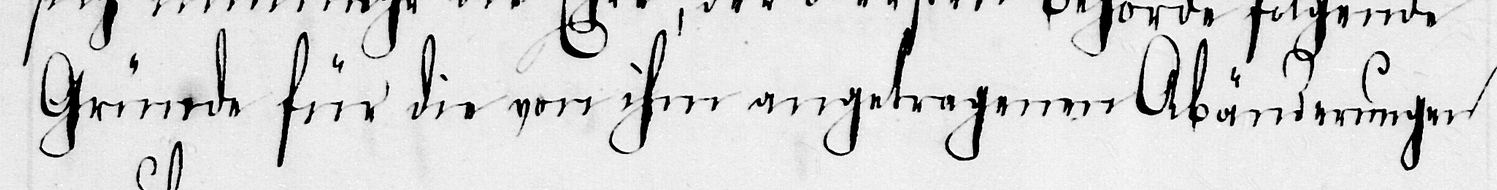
Gründe für die von ihm angetragenen Abänderungen
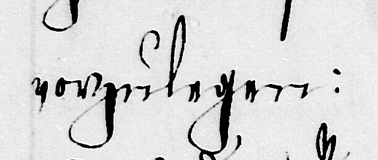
vorzulegen:
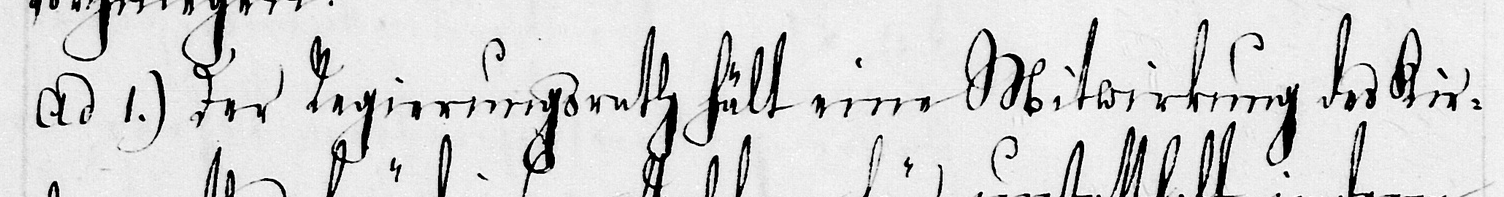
ad. 1.) Der Regierungsrath hält eine Mitwirkung des Kir¬
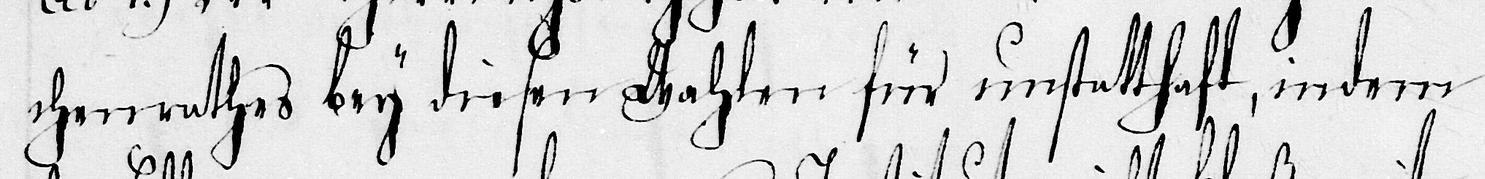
chenrathes bey diesen Wahlen für unstatthaft, indem
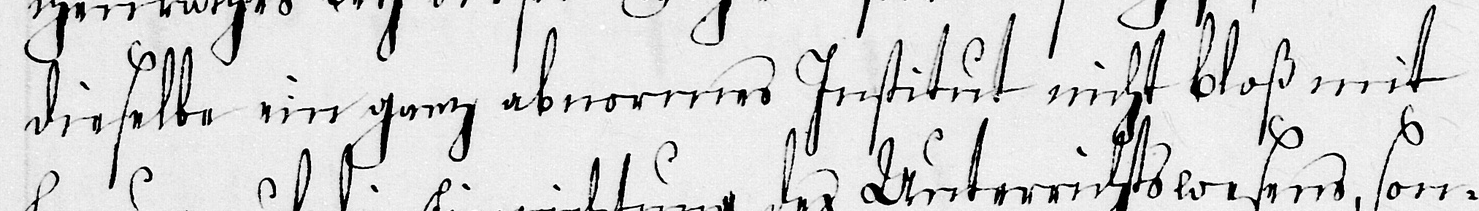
dieselbe ein ganz abnormes Institut nicht bloß mit
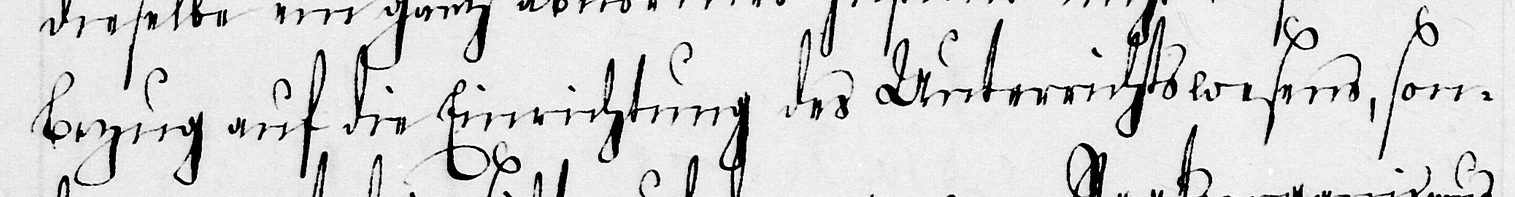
Bezug auf die Einrichtung des Unterrichtswesens, son¬
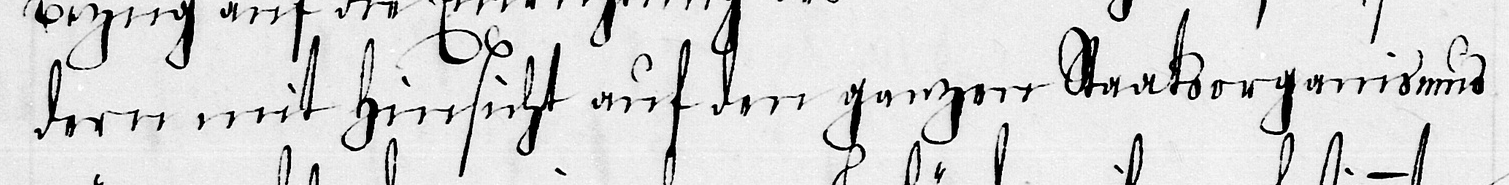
dern mit Hinsicht auf den ganzen Staatsorganismus
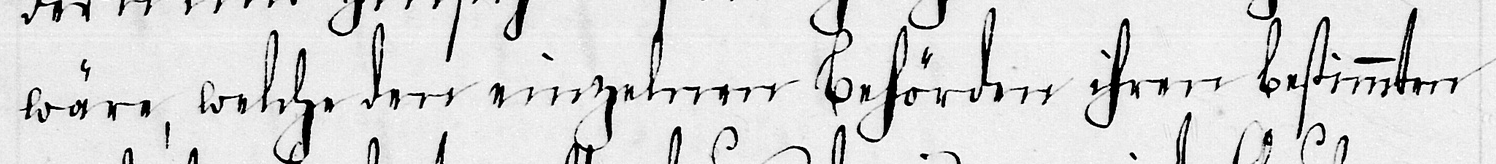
wäre, welche den einzelnen Behörden ihren bestimmten
